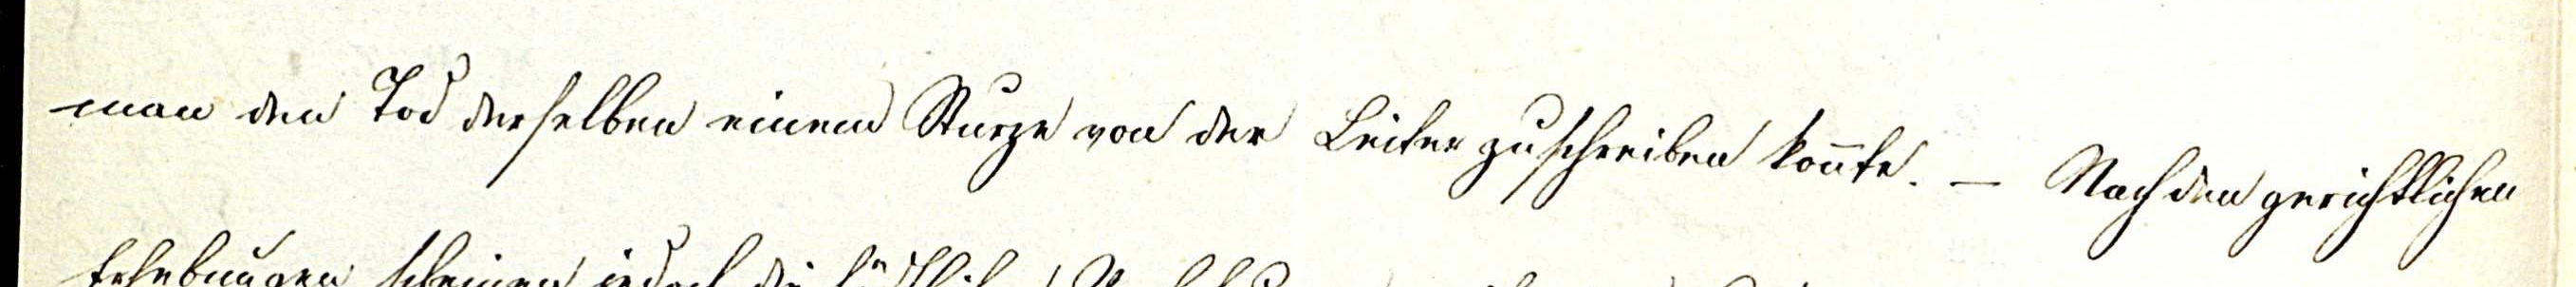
man den Tod derselben einen Sturze von der Leiter zuschreiben konnte. Nach den gerichtlichen
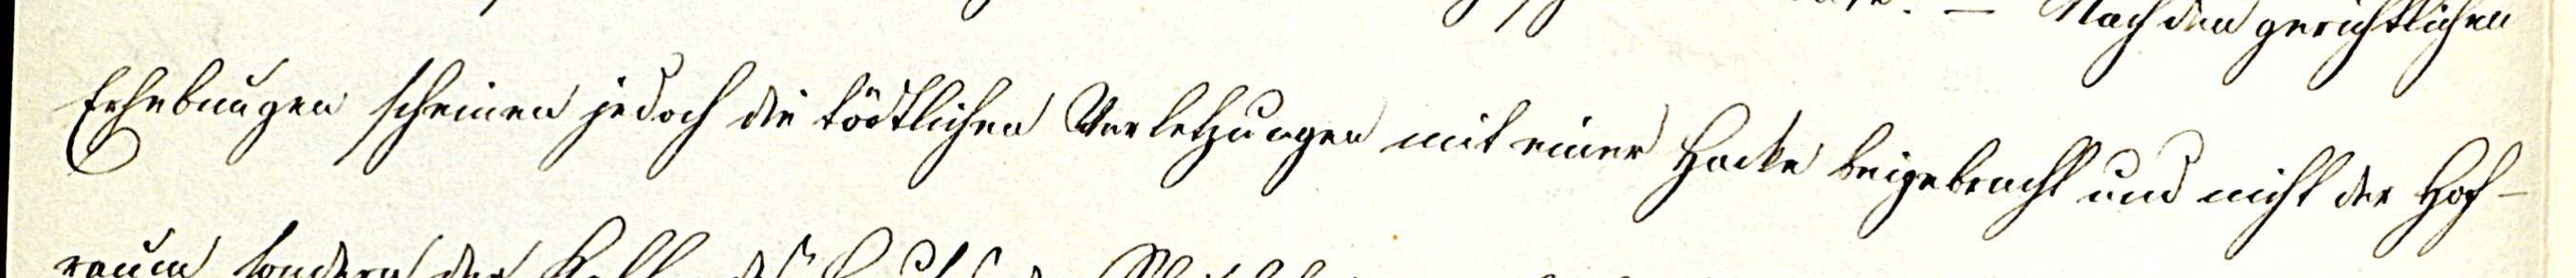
Erhebungen scheinen jedoch die tödtlichen Verletzungen mit einer Hacke beigebracht und nicht der Hof¬
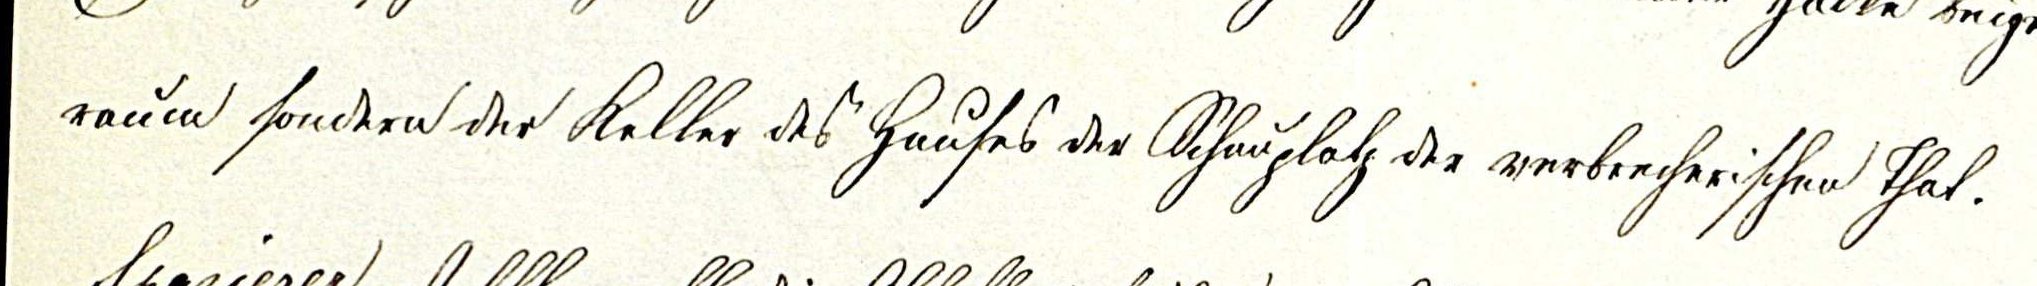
raum sondern der Keller des Hauses der Schauplatz der verbrecherischen That.
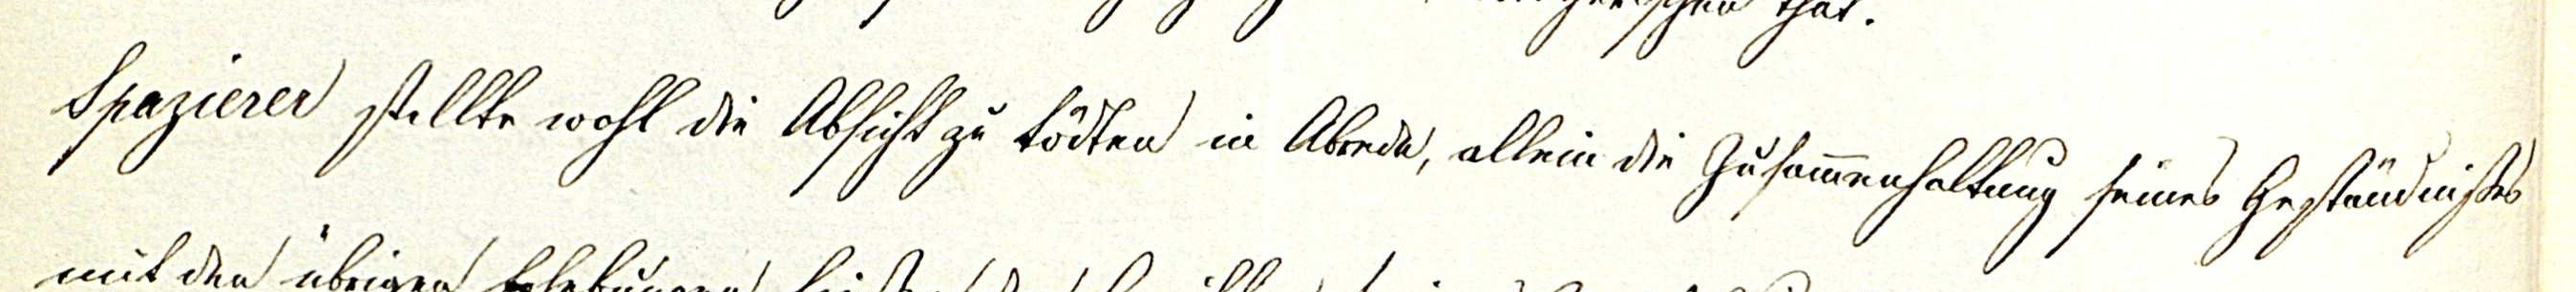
Spazierer stellte wohl die Absicht zu tödten in Abrede, allein die Zusammenhaltung seines Geständnißes
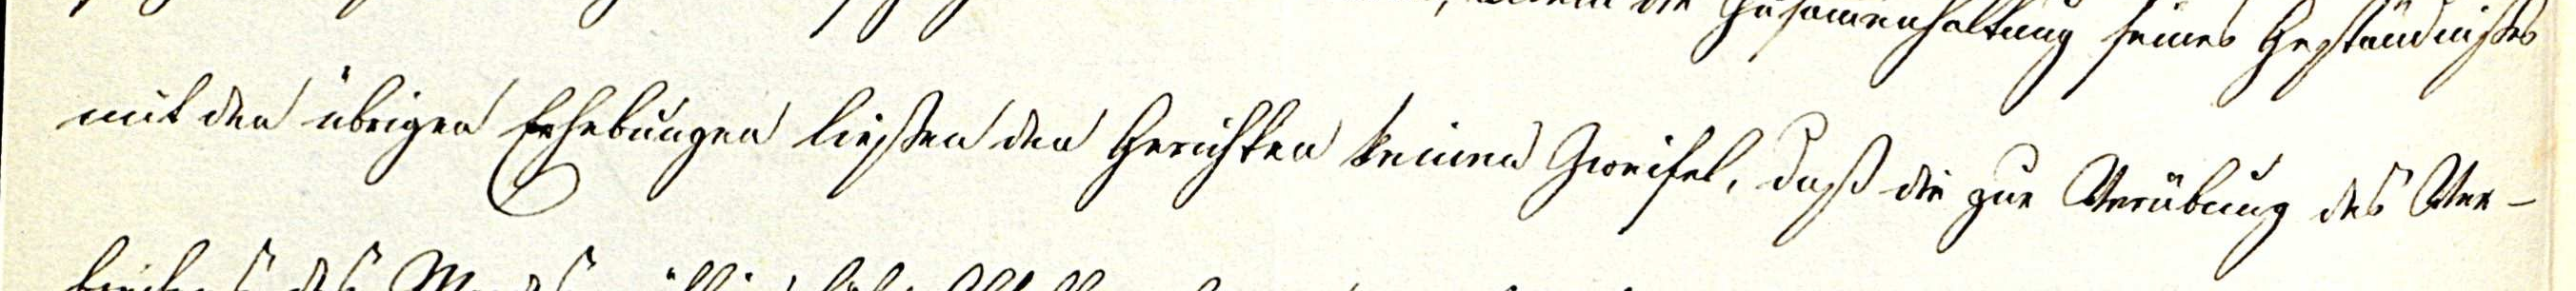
mit den übrigen Erhebungen ließen den Gerichten keinen Zweifel, daß die zur Verübung des Ver¬
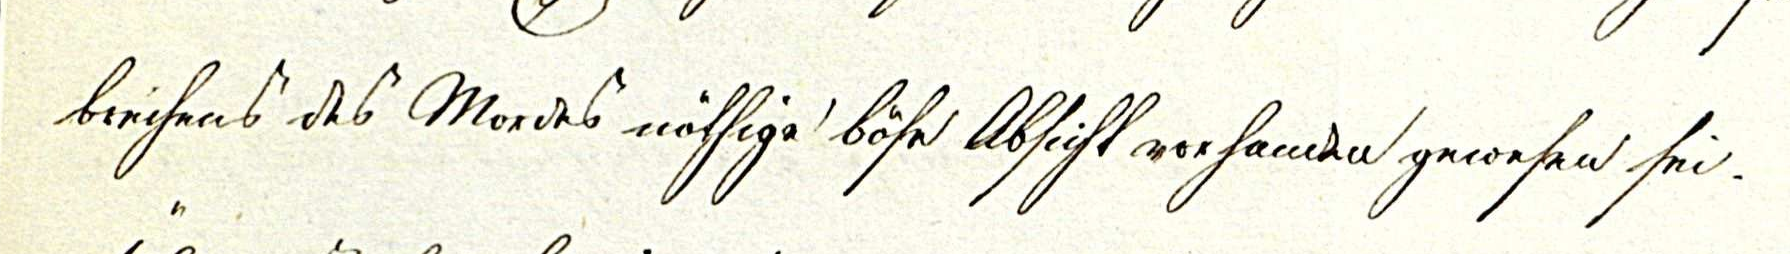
brechens des Mordes nöthige böse Absicht vorhanden gewesen sei.
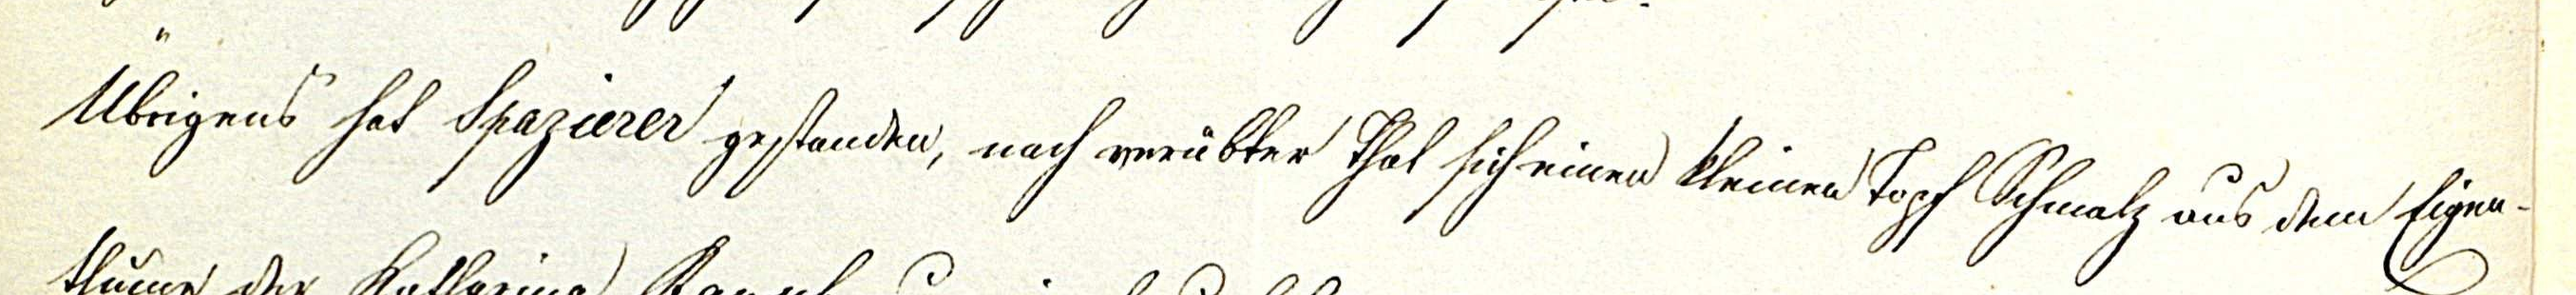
Übrigens hat Spazierer gestanden, nach verübter That sich einen kleinen Topf Schmalz aus dem Eigen¬
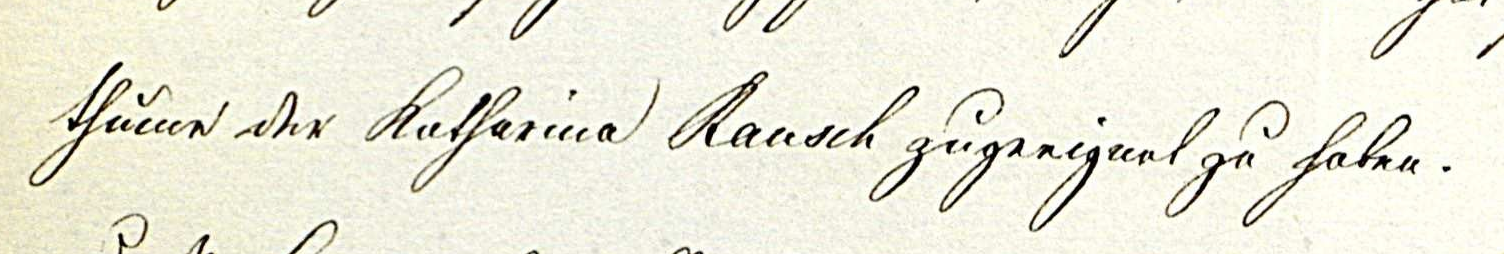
thume der Katharina Rausch zugeeignet zu haben.
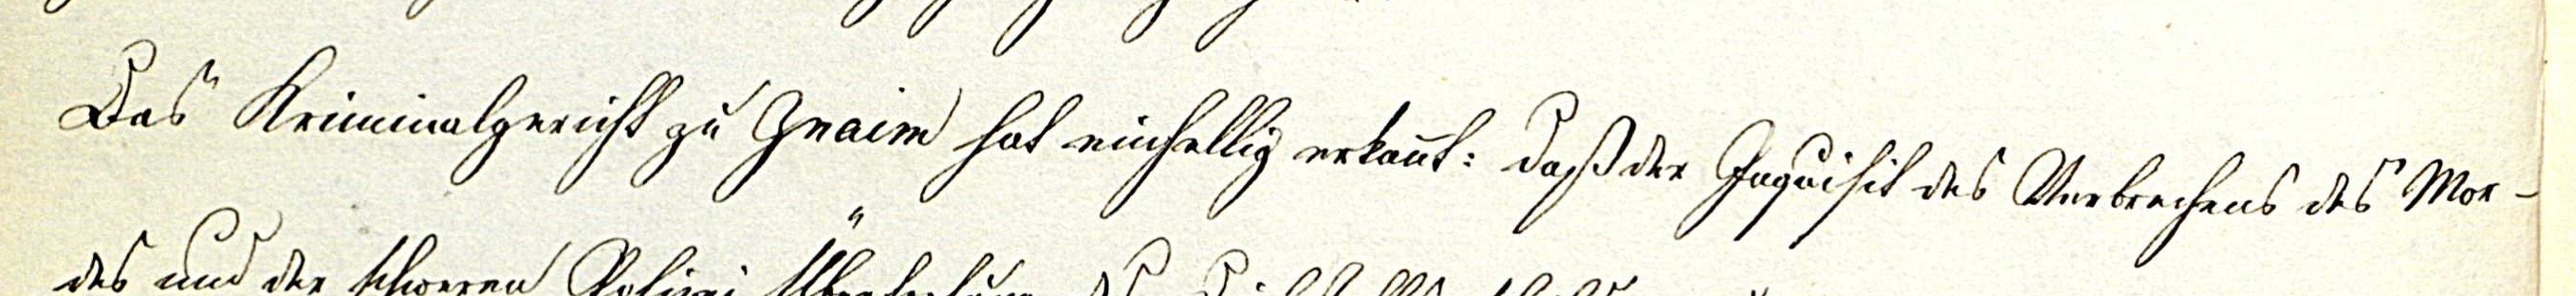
Das Kriminalgericht zu Znaim hat einhellig erkannt: daß der Inquisit des Verbrechens des Mor¬
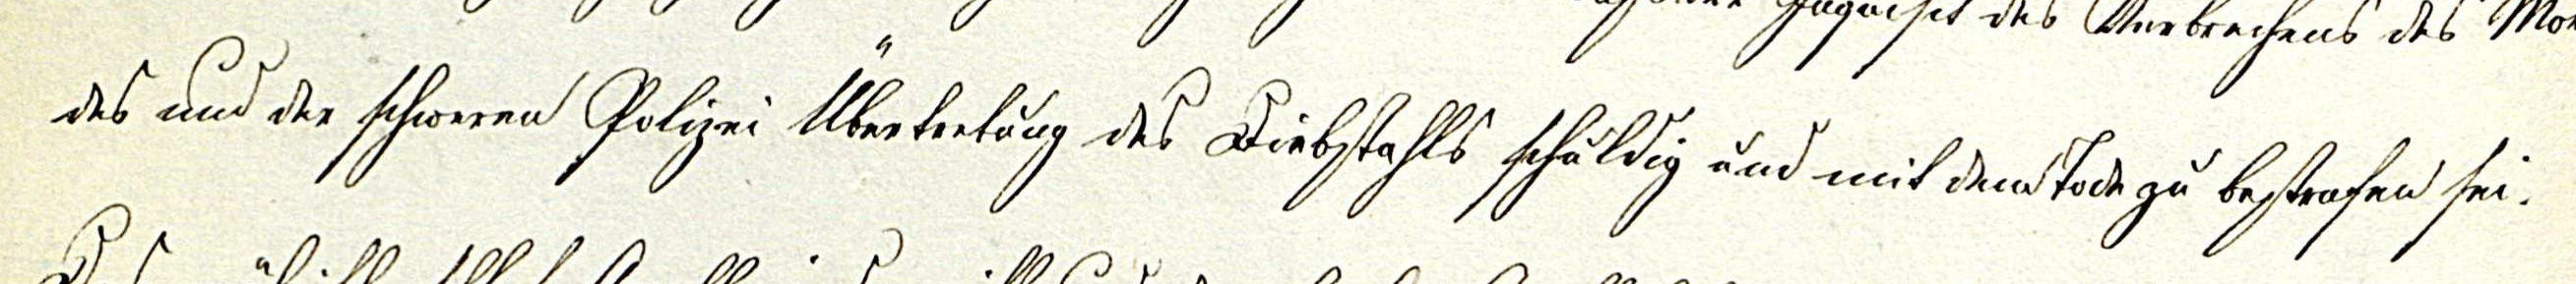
des und der schweren Polizei Übertretung des Diebstahls schuldig und mit dem Tode zu bestrafen sei.
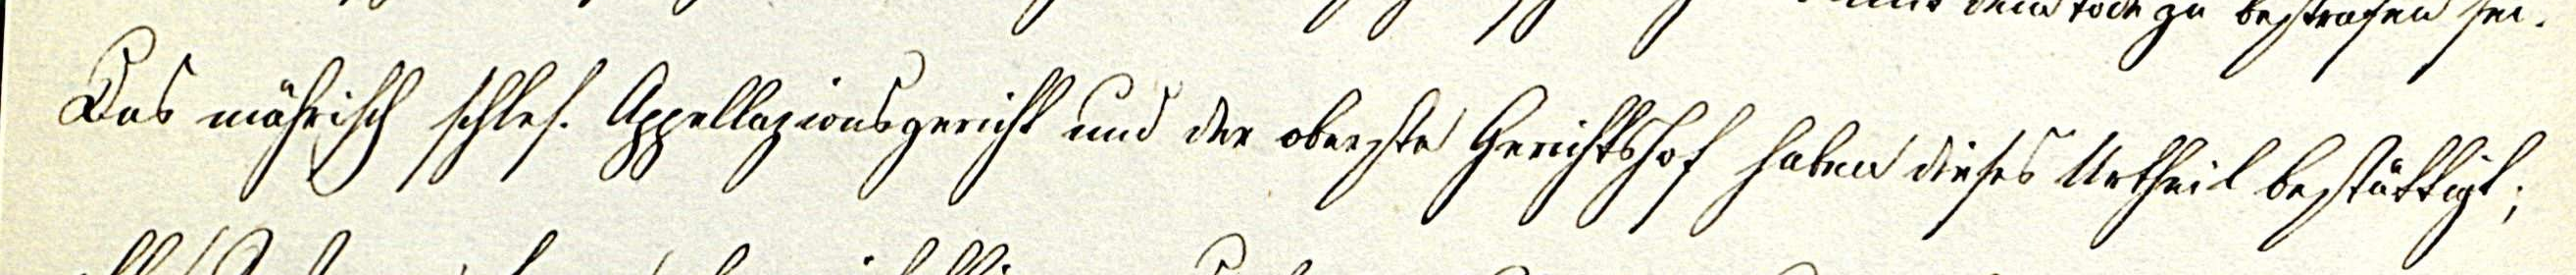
Das mährisch schles. Appellazionsgericht und der oberste Gerichtshof haben dieses Urtheil bestättigt;
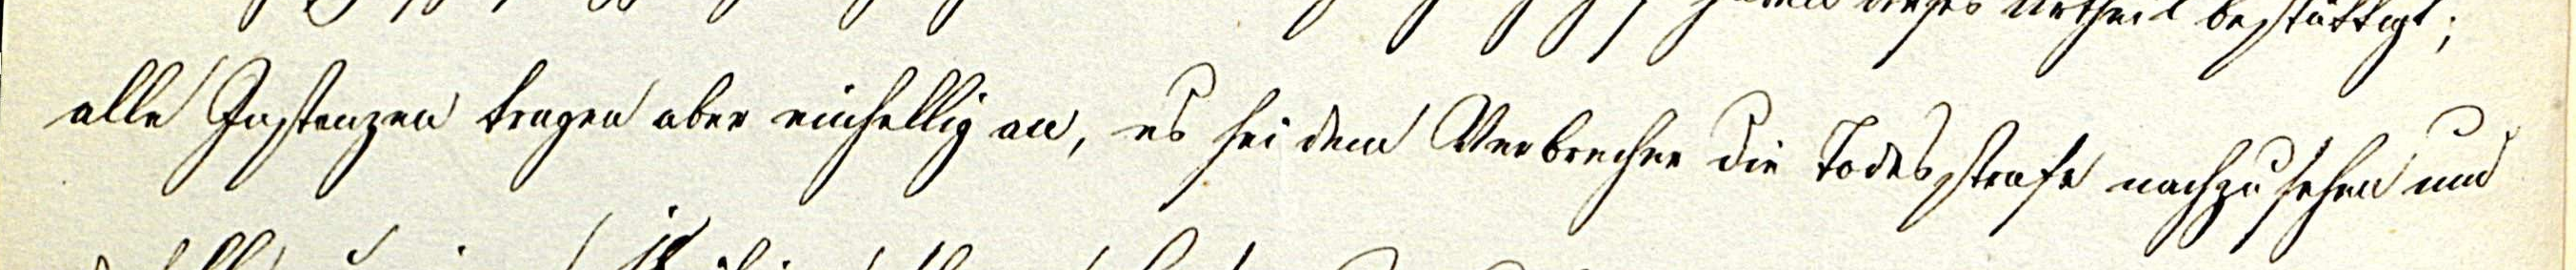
alle Instanzen tragen aber einhellig an, es sei dem Verbrechen die Todesstrafe nachzusehen und
